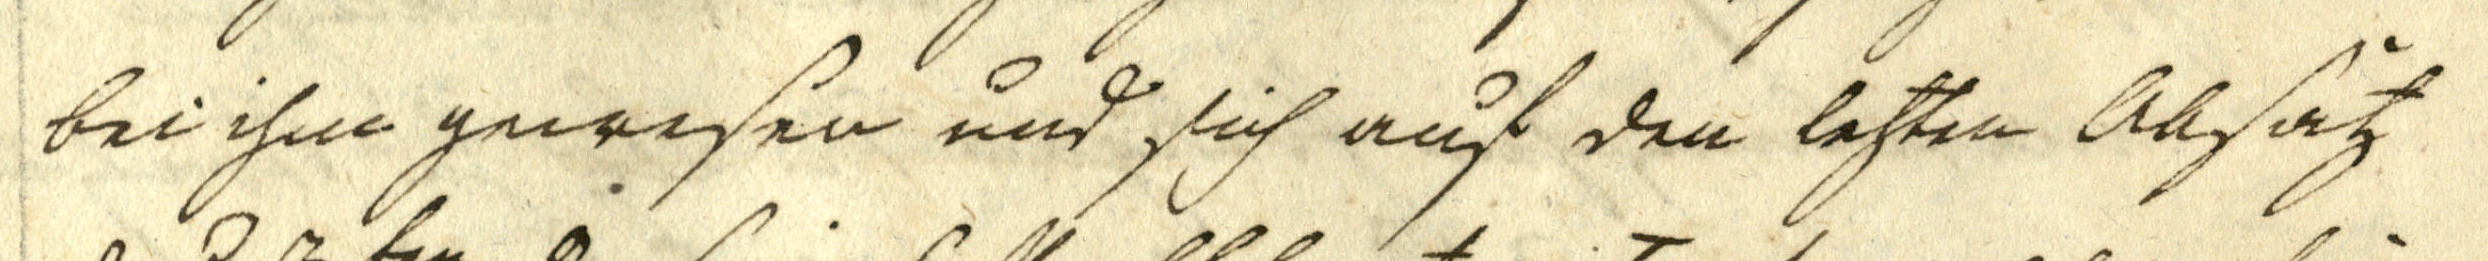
bei ihm gewesen und sich auf den letzten Absatz
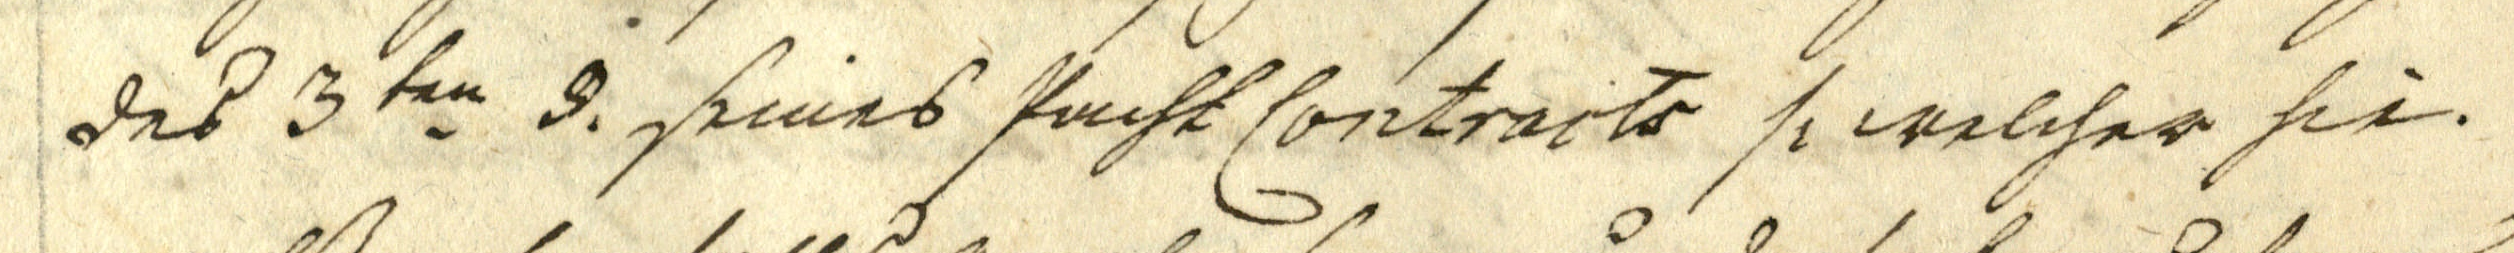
des 3 ten §. seines Pacht Contracts /: welcher hie¬
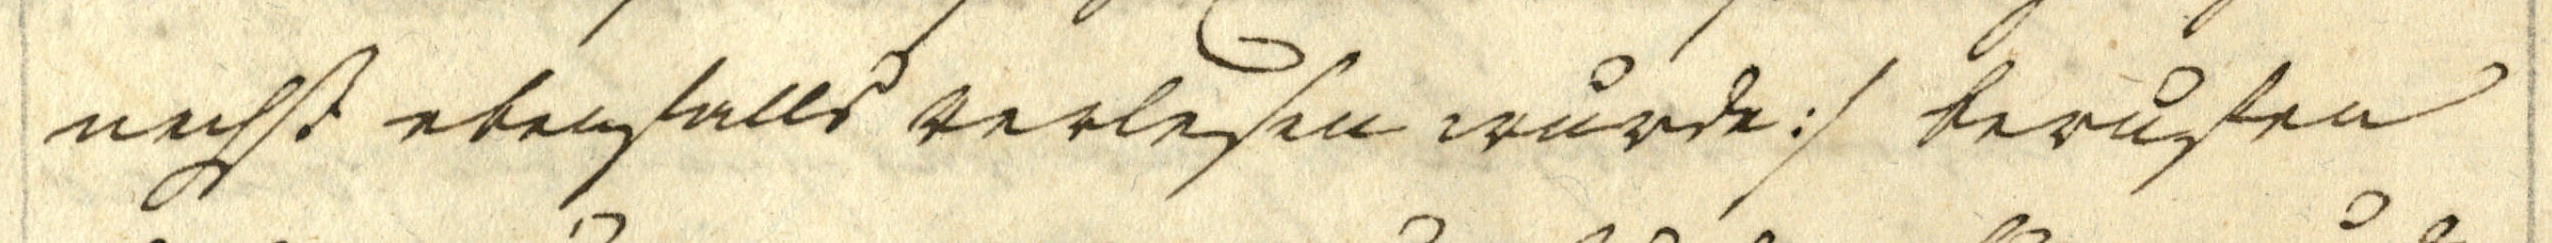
nechst ebenfalls verlesen wurde:/ berufen
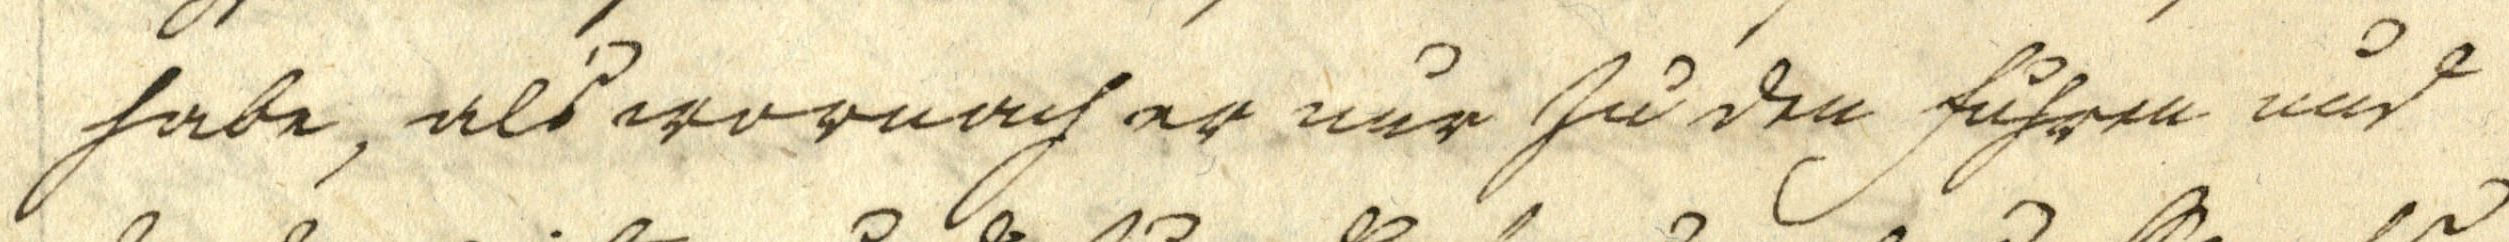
habe, als wornach er nur zu den Fuhren und
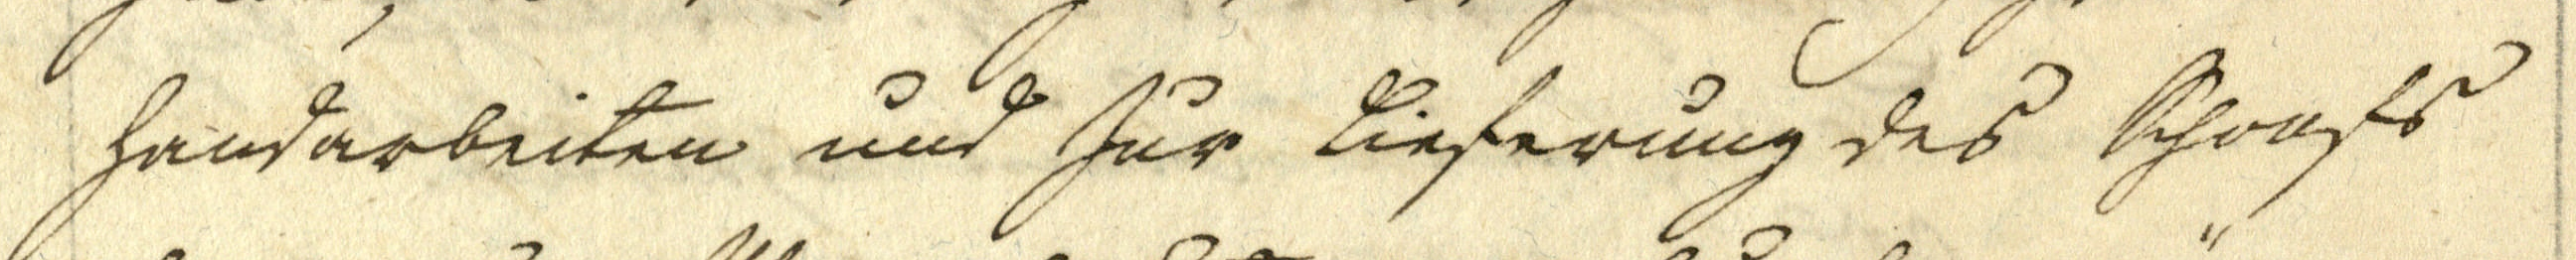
Handarbeiten und zur Lieferung des Schoofs
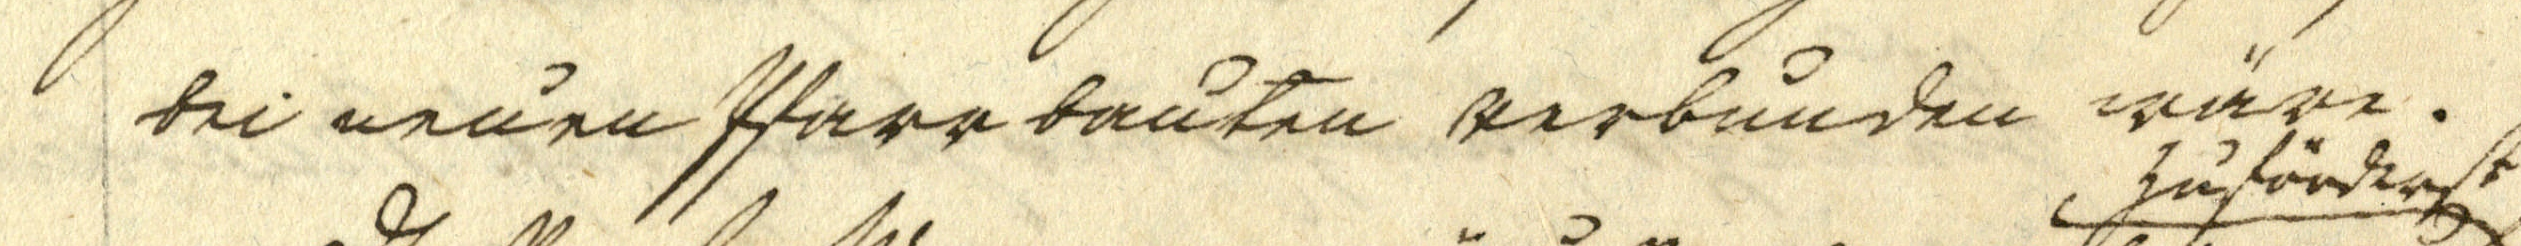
bei neuen Pfarr bauten verbunden wäre.
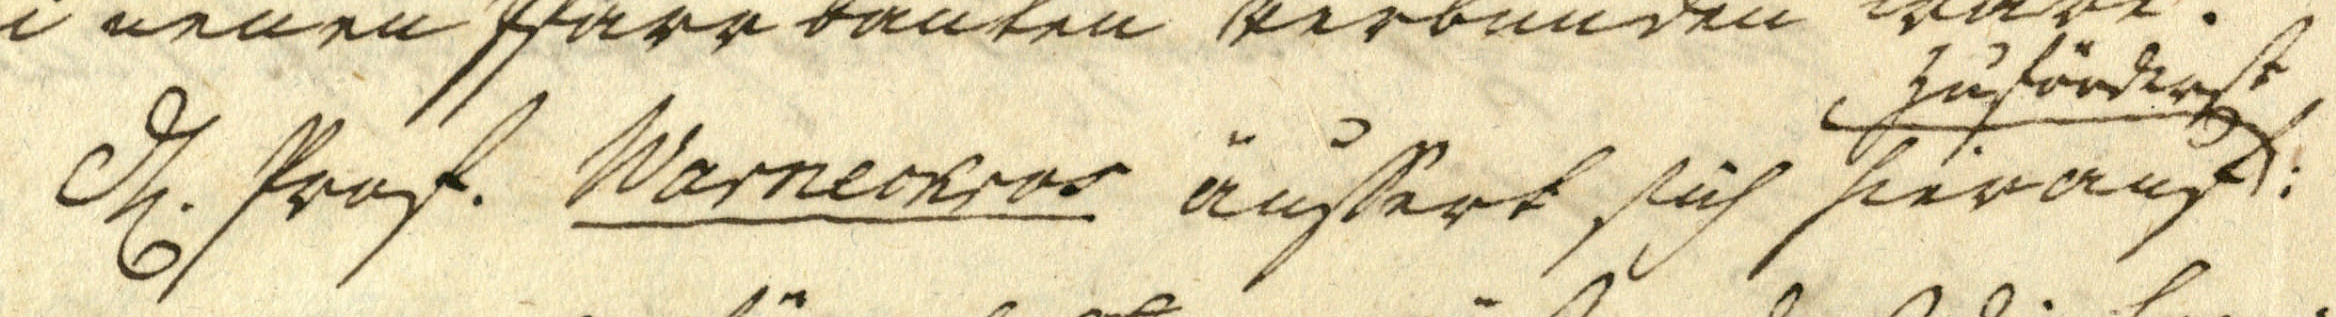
dh. Prof. Warneckros äussert sich hierauf zuförderst:
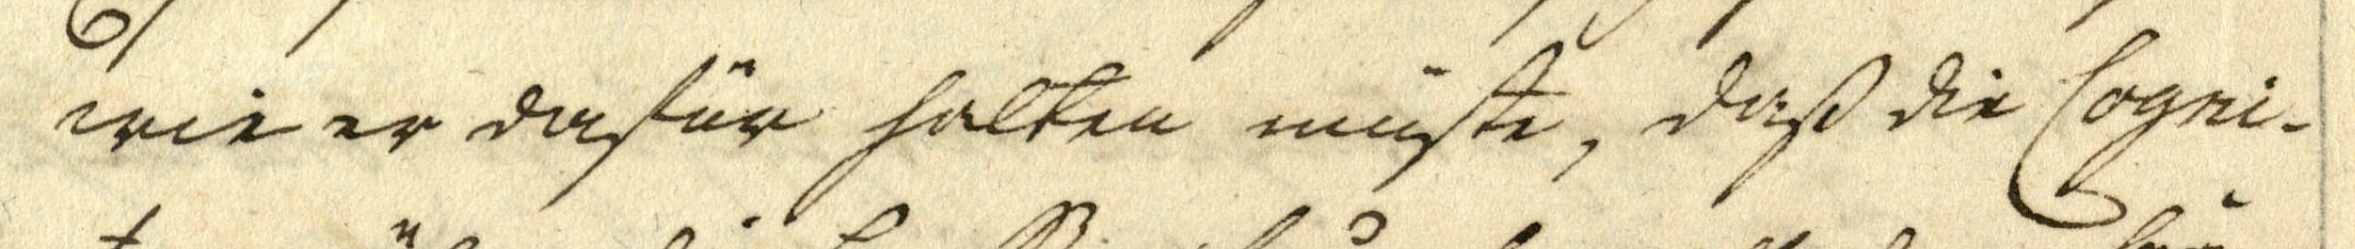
wie er dafür halten müßte, daß die Cogni¬
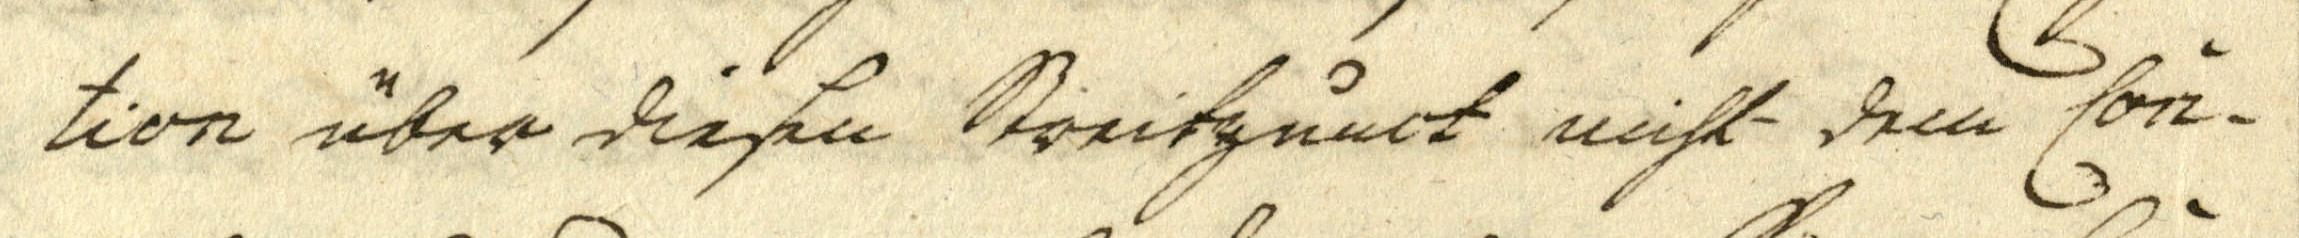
tion über diesen Streitpunct nicht dem Con¬
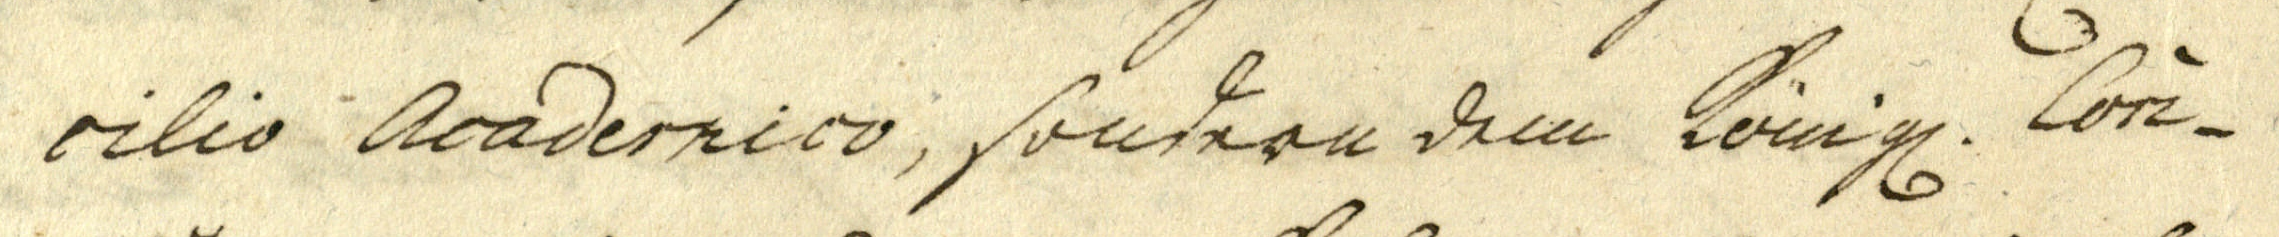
cilio Academico, sondern dem Königl. Con¬
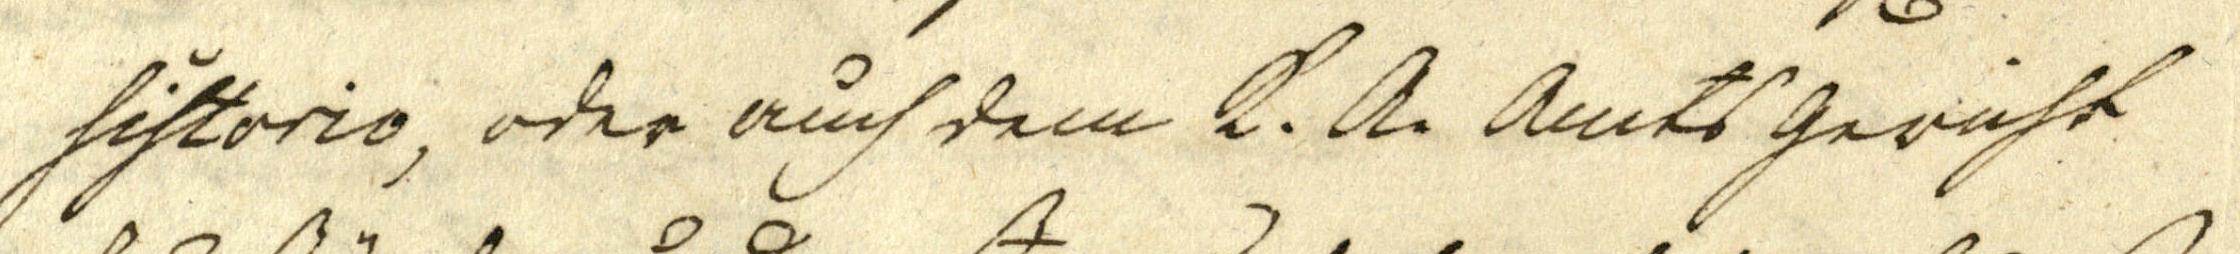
sistorio, oder auch dem K. A. Amts Gericht
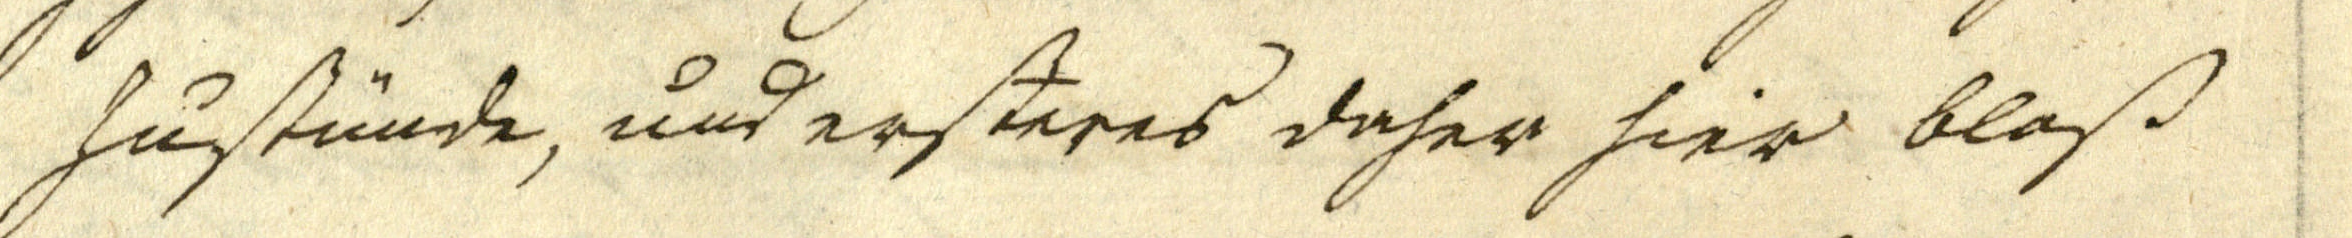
zustünde, und ersteres daher hier bloß
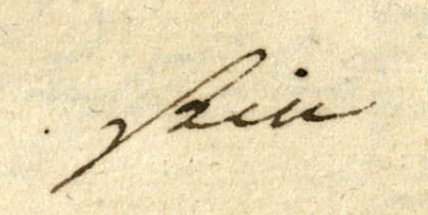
sein
